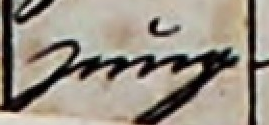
zung
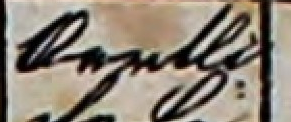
Oertli„
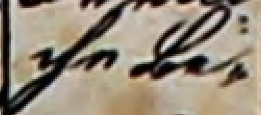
che Ben???„
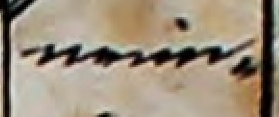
ung
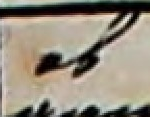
ob
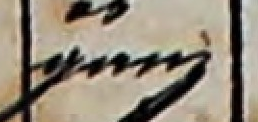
ganz
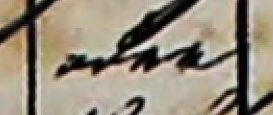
wer
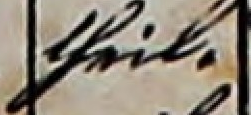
theil.
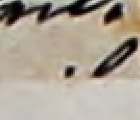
weise
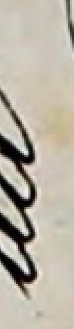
ad
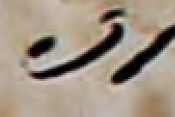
51
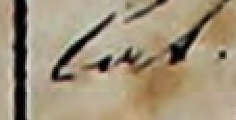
Cat.
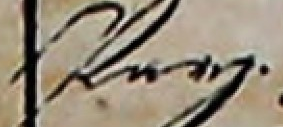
Perg.
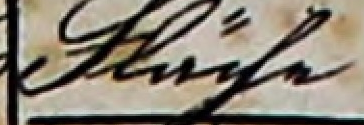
Fläche
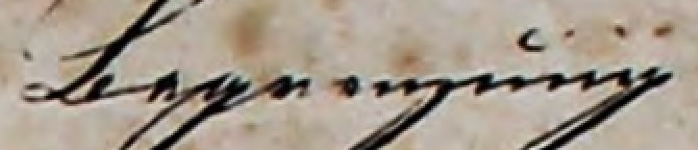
Begrenzung
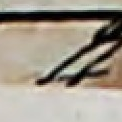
J.
